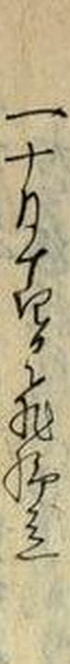一十月十四日飛脚立
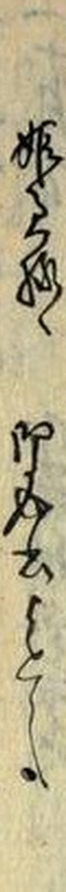姫君様へ御返書被進之
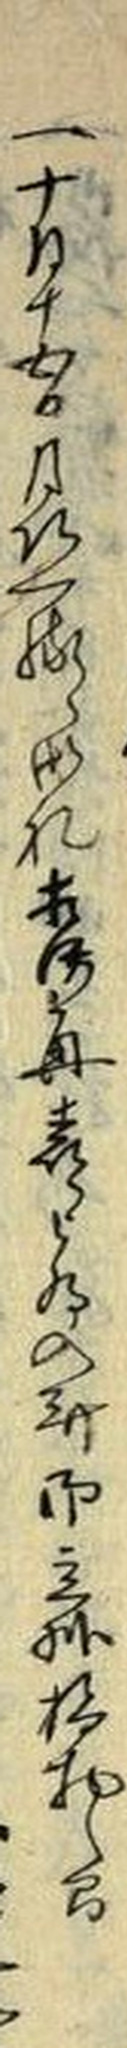一十月十五日月次一統之御礼相済再表へ被為入即御立掛指物之間
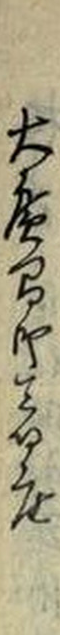大広間御着座
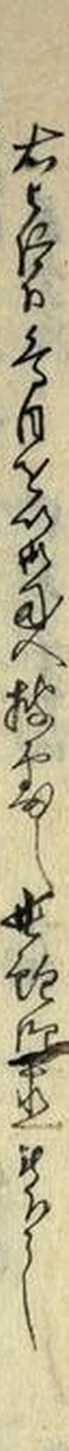右被仰付鳥目を以御用人披露之長鮑御直被下之
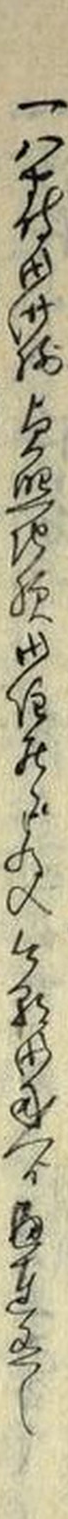一八半時御供揃貞照院様御住居へ被為入今朝御用人ゟ通達有之
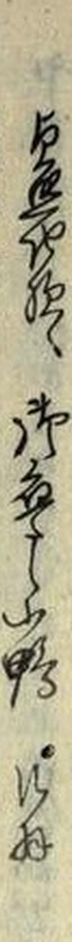貞照院様へ御鷹之小鴨弐羽
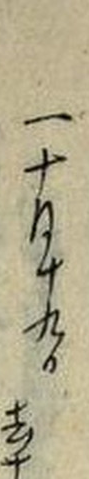一十月廿日
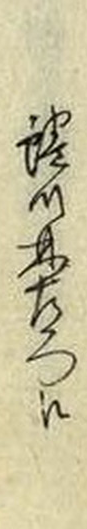蜷川林左衛門江
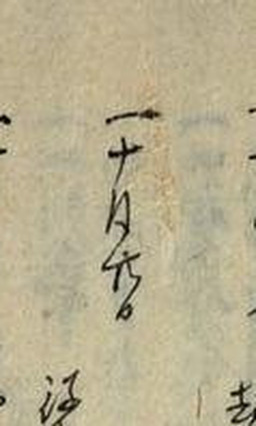一十月廿日
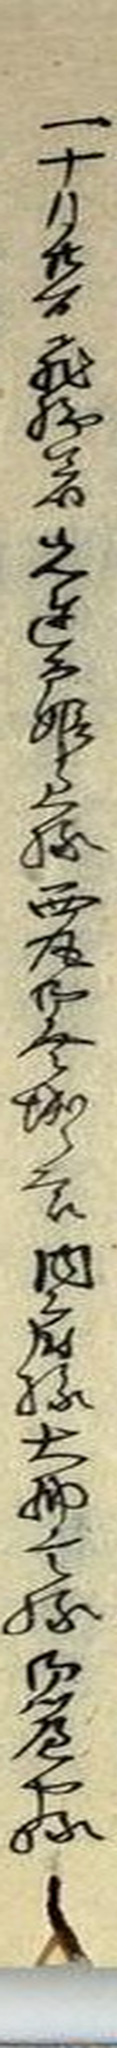一十月廿一日飛脚着先達而姫君様西丸御登城之節内府様大納言様御簾中様
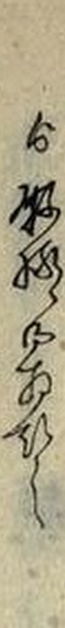ゟ殿様へ御拝領之
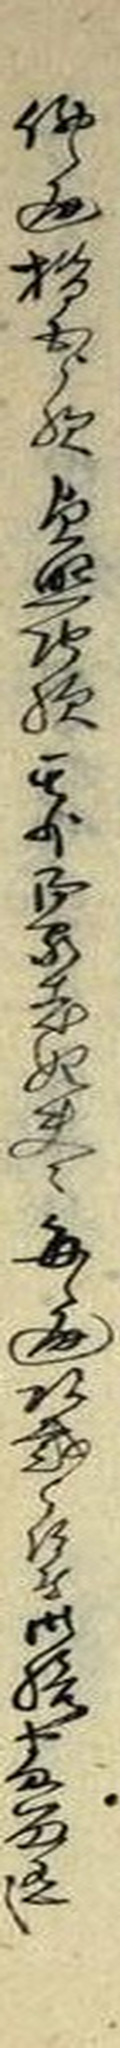例之通揩五郎様貞照院様其外御家老始夫々毎々通頂戴被仰付御膳番留有之

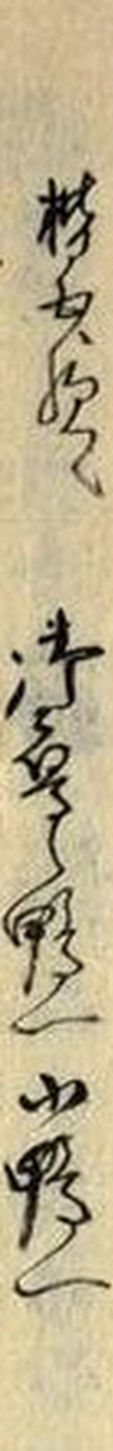揩五郎様へ御鷹之鴨一小鴨一
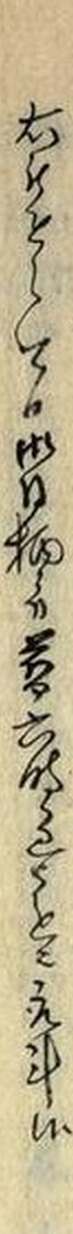右被進之今日御日柄ニ付暮六時過被進ニ取斗候
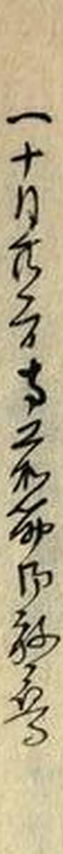一十月廿二日寺前筋御放鷹
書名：少傅日録抄（斉承付側向頭取日記、在国）
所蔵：福井県文書館 Fukui Prefectural Archives
